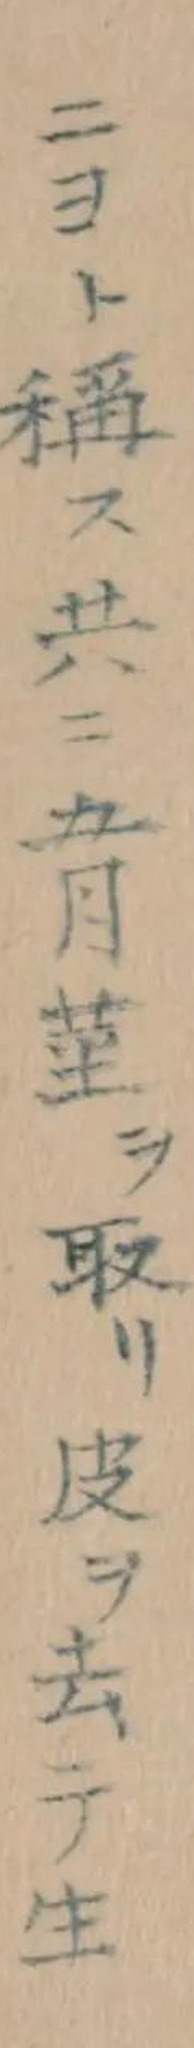ニヨト称ス共ニ五月茎ヲ取リ皮ヲ去テ生

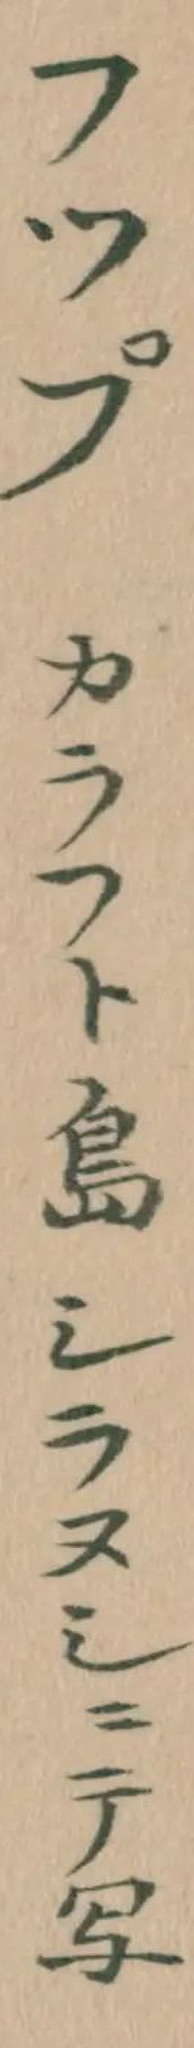フツプカラフト島シラヌシニテ写
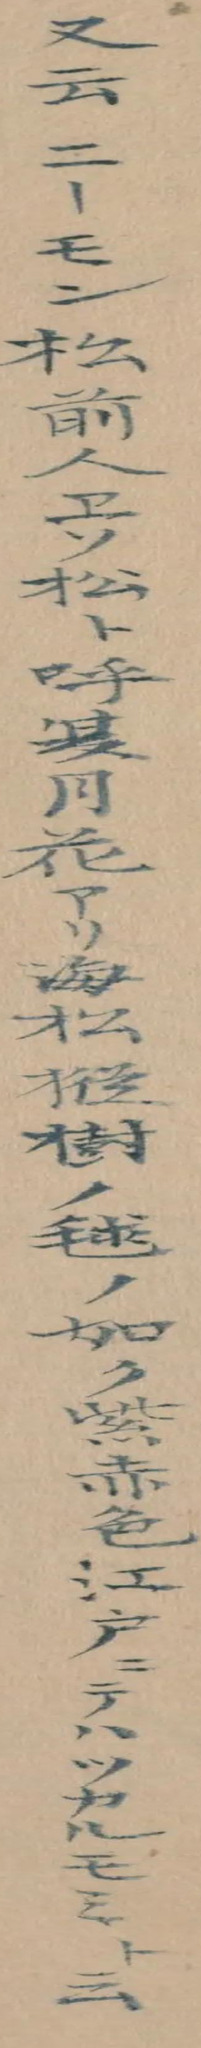又云ニーモン松前人ヱソ松ト呼夏月花アリ海松樅樹ノ毬ノ如ク紫赤色江戸ニテハツカルモミト云
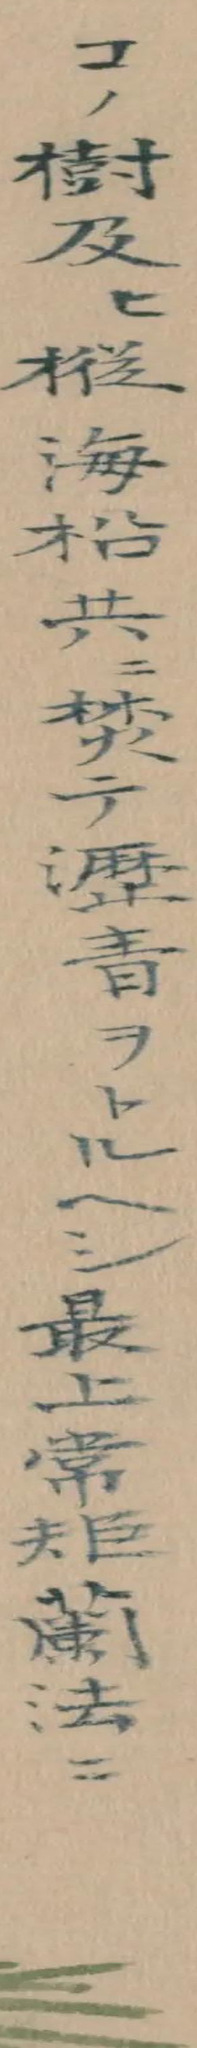コノ樹及ヒ樅海松共ニ焚テ瀝青ヲトルヘシ最上常蘭法ニ
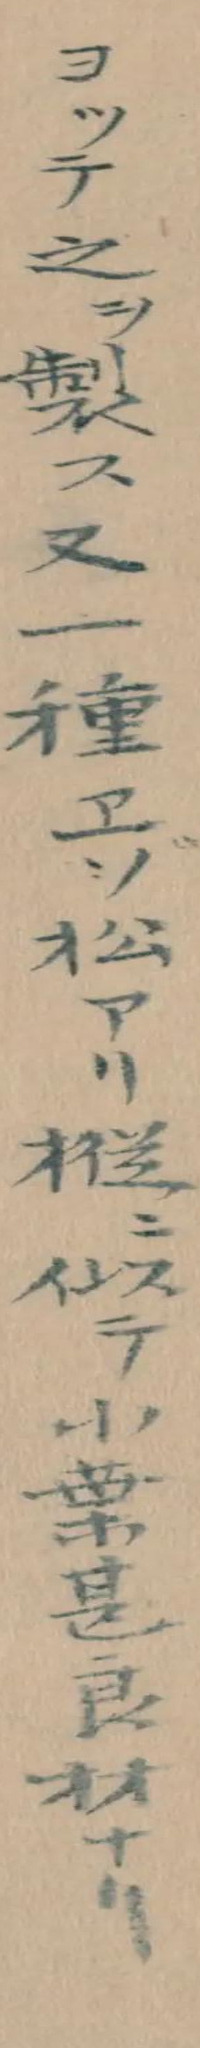ヨッテ之ヲ製ス又一種ヱゾ松アリ樅ニ似テ小葉甚良材ナリ

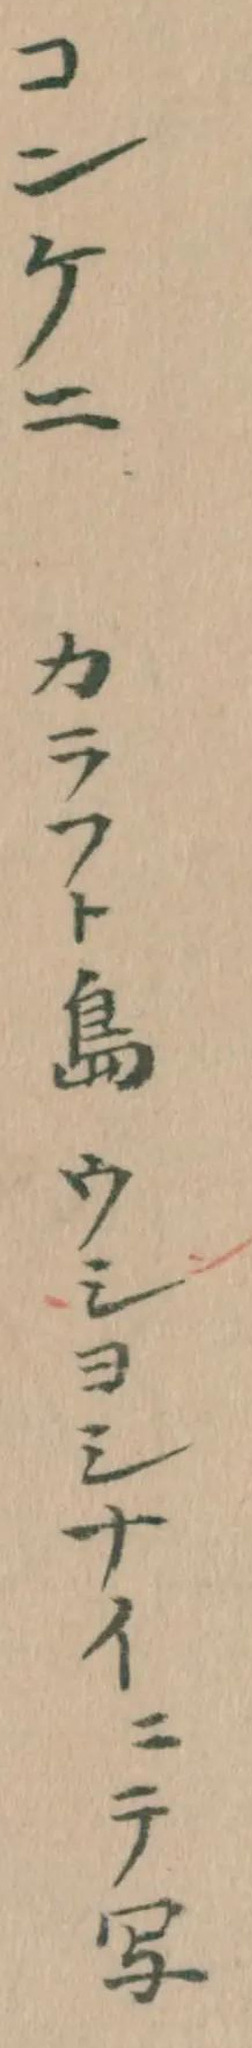コンケニカラフト島ウシヨシナニテ写
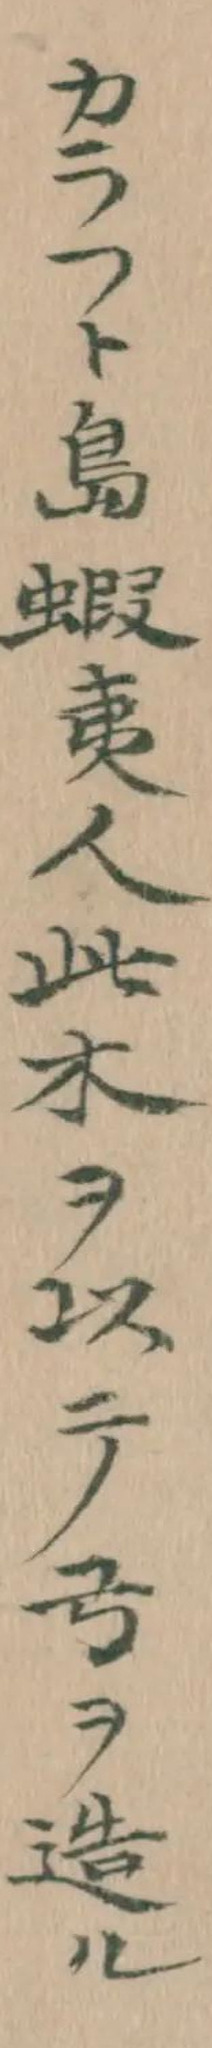カラフト島蝦夷人此木ヲ以テ弓ヲ造ル
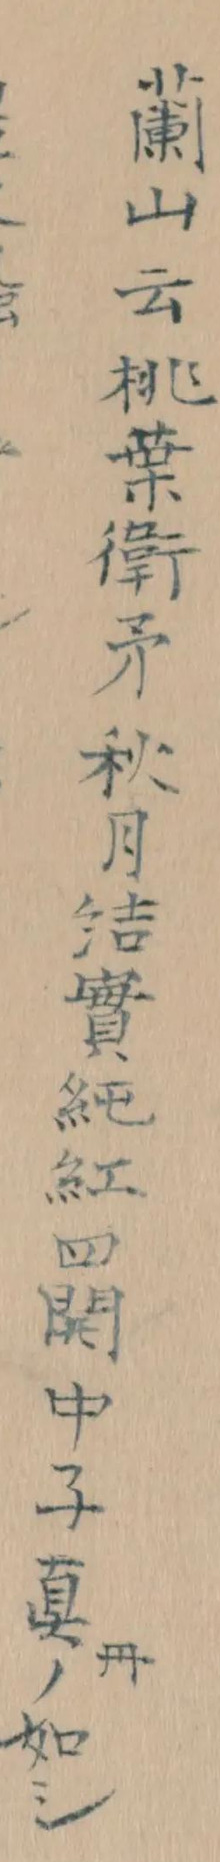蘭山云桃葉衛矛秋月結実純紅四開中子真ノ如シ

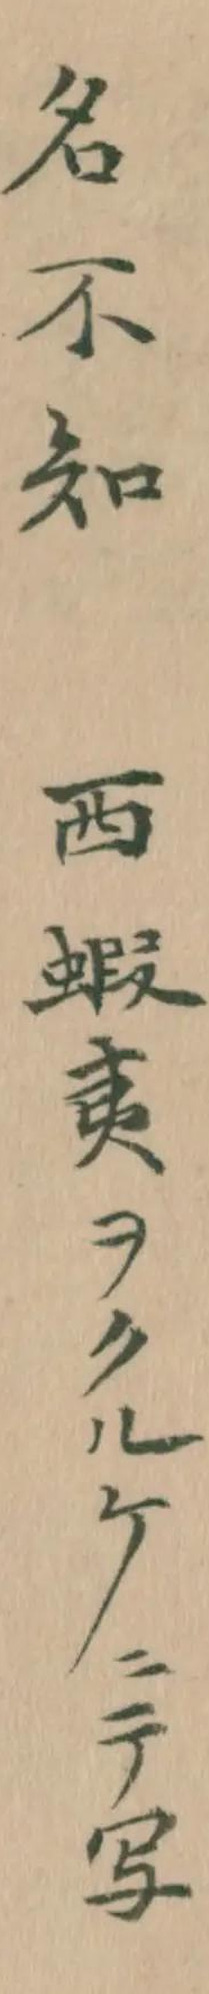名不知西蝦夷ヲクケニテ写
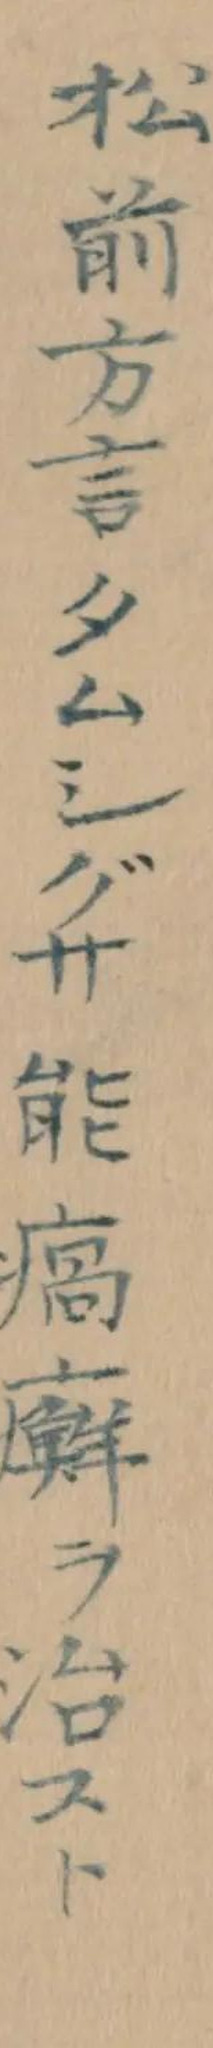松前方言タムシグサ能瘑癬ヲ治スト

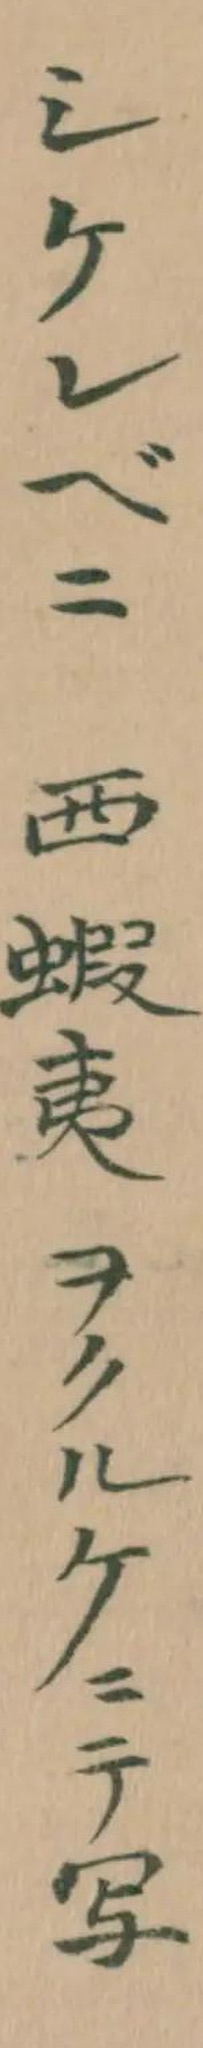シケレベニ西蝦夷ヲクルケニテ写
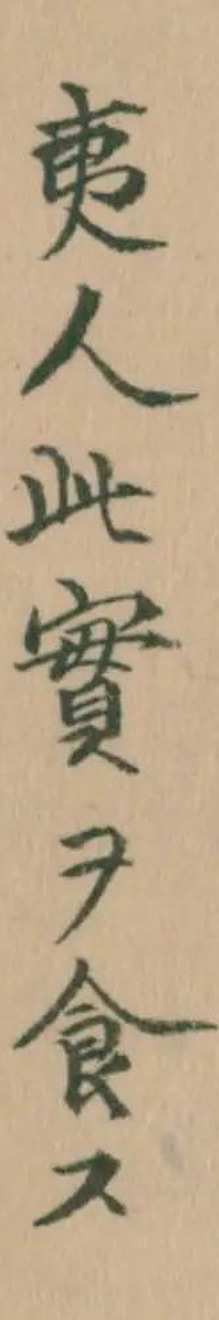夷人此実ヲ食ス
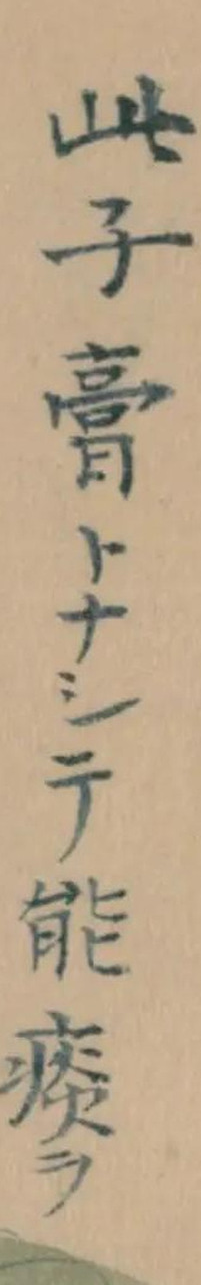此子膏トナシテ能痰ヲ
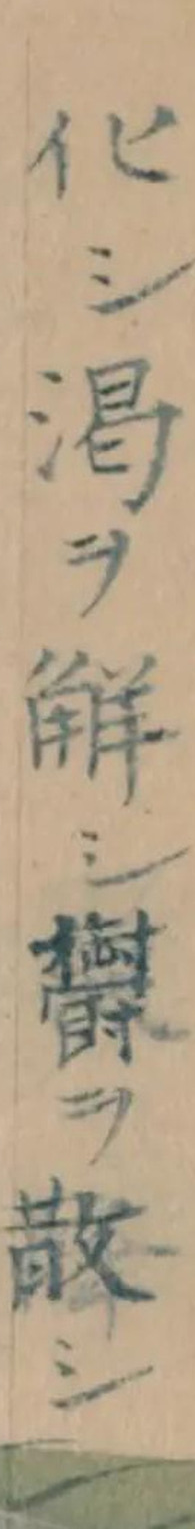化シ渇ヲ解シ鬱ヲ散シ
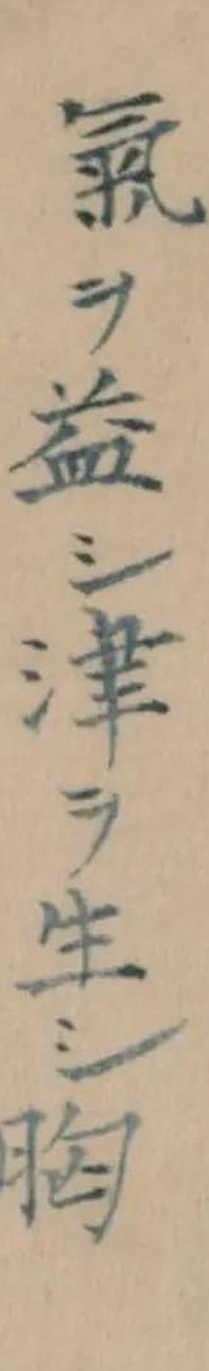気ヲ益シ津ヲ生シ胸
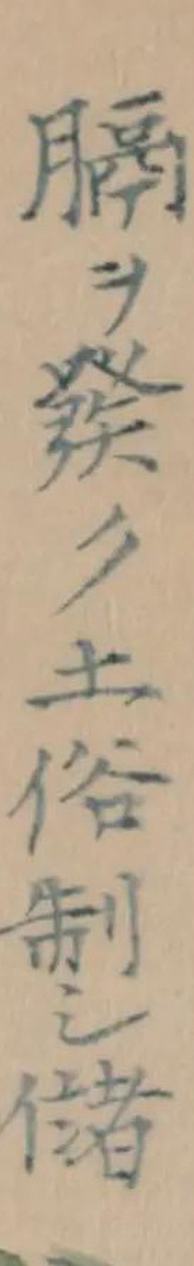膈ヲ発ク土俗制シ儲
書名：蝦夷草木図
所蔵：国立国会図書館 National Diet Library, JAPAN
